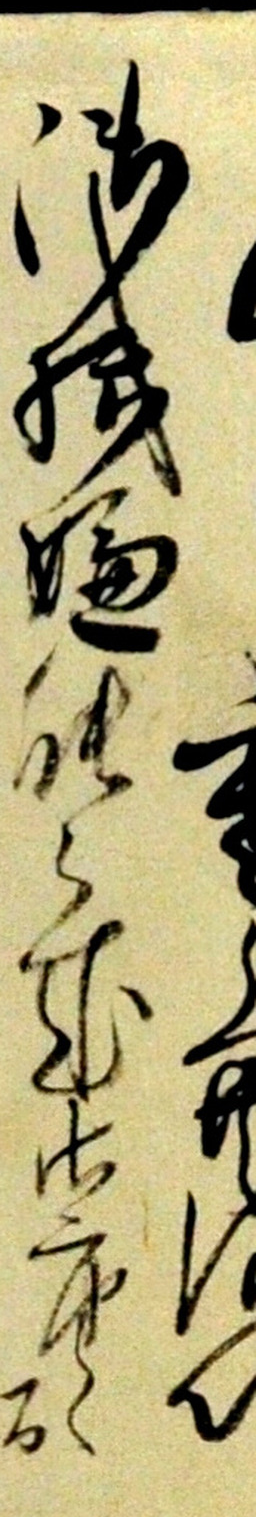御機嫌能被成御座候間
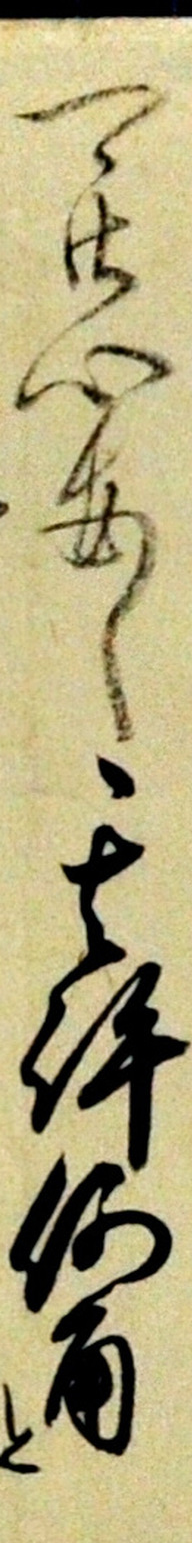可御心安候其許何角と
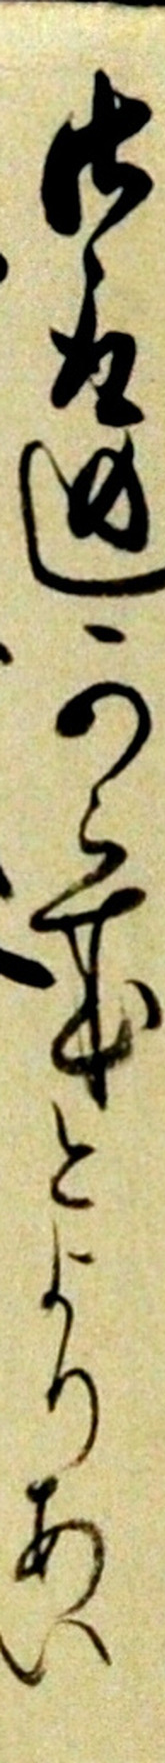御取込可被成とよりあい
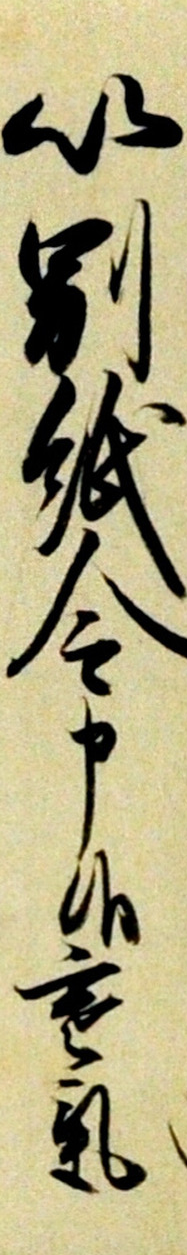以別紙令申候寒気
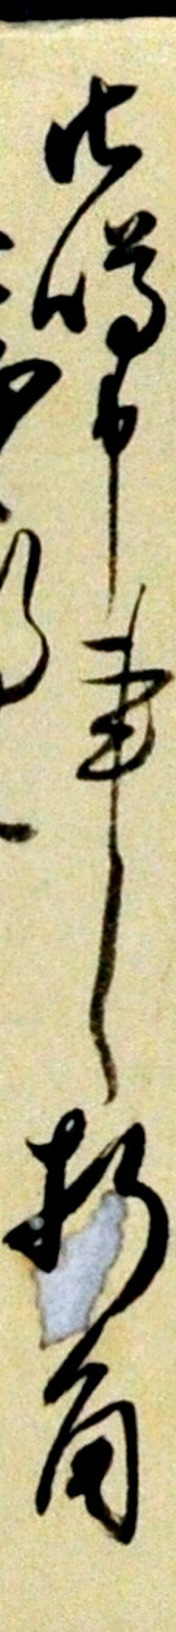御噂申事候折角
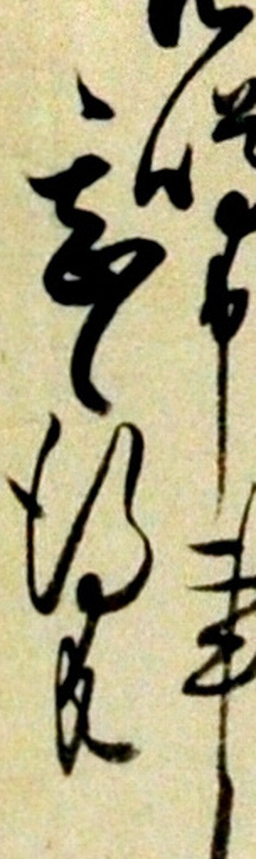甚候得共
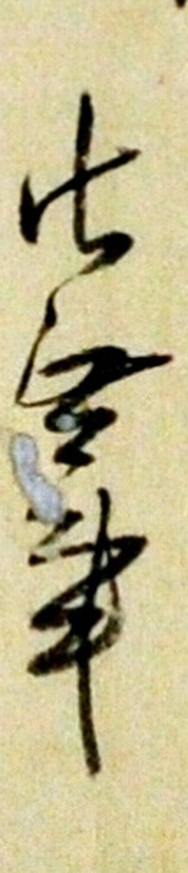御無事
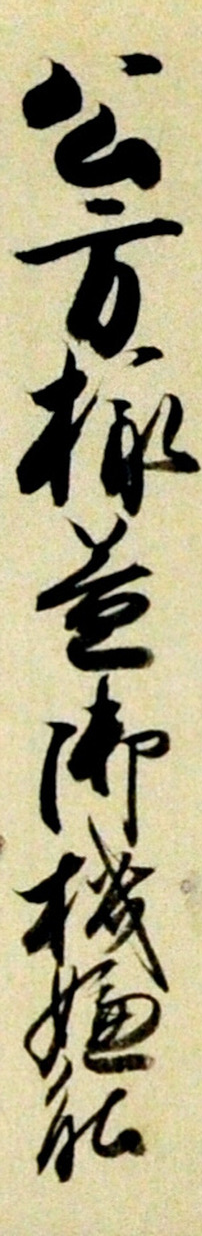公方様益御機嫌能
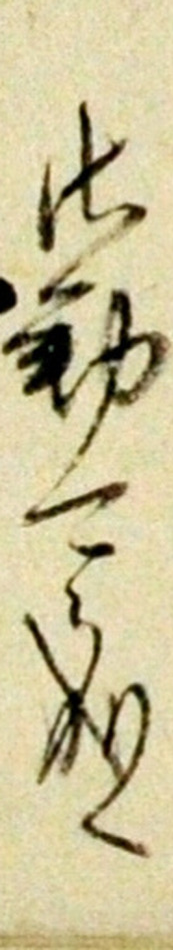御勤可被成候
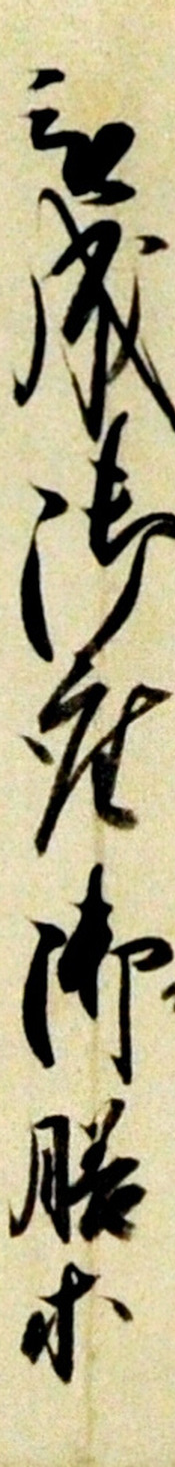被成御座御膳等
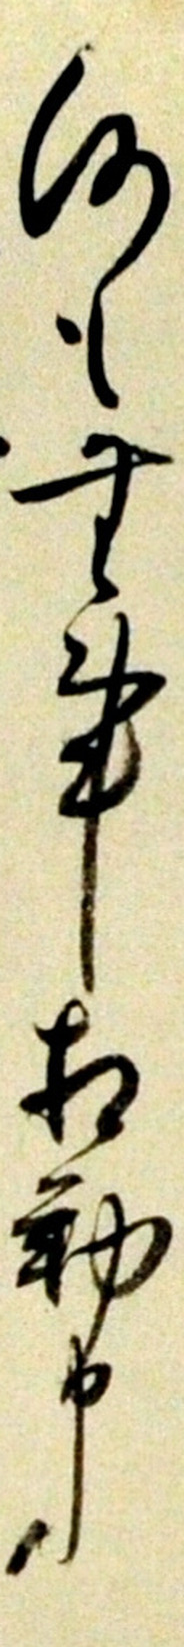何も無事相勤申候
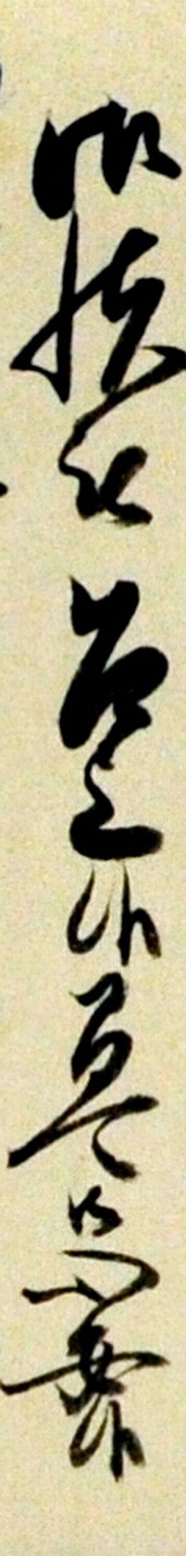御快被召上候間可御心安候
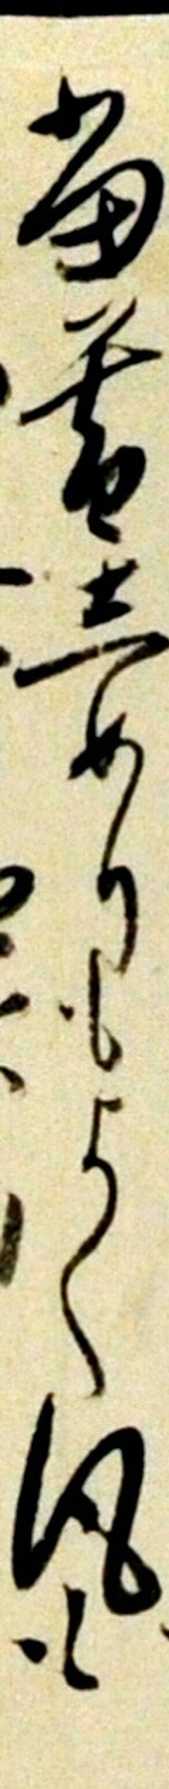当暮しめりもよく風も
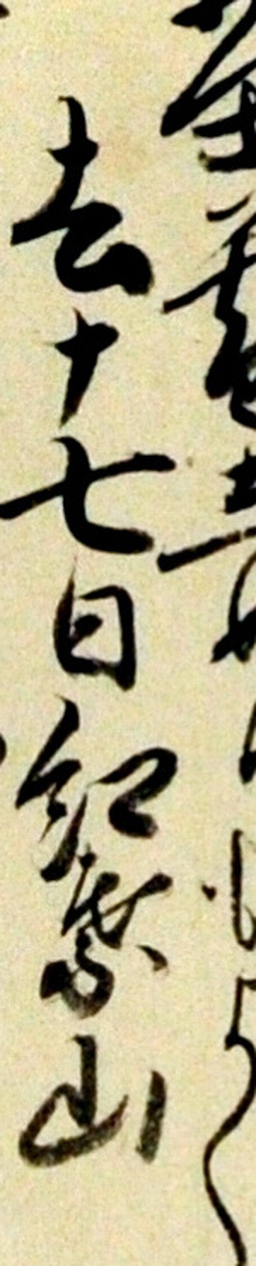去十七日紅葉山
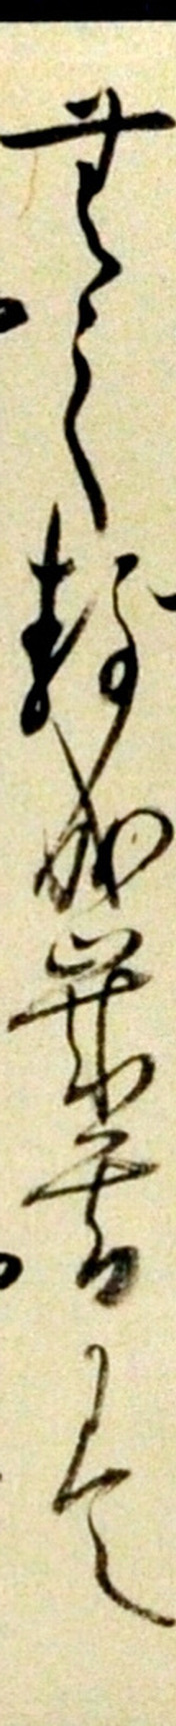無之静成歳暮にて
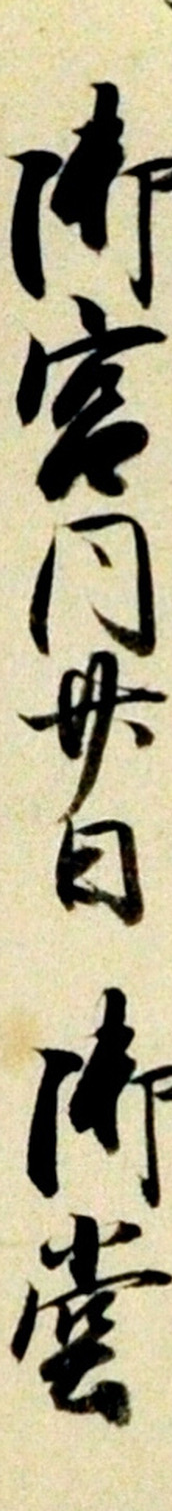御宮同廿日御堂
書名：書状
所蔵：伊那市立高遠町図書館・合同会社AMANE
